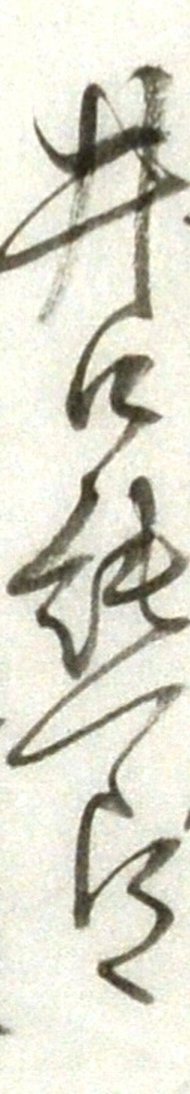井口純一郎
